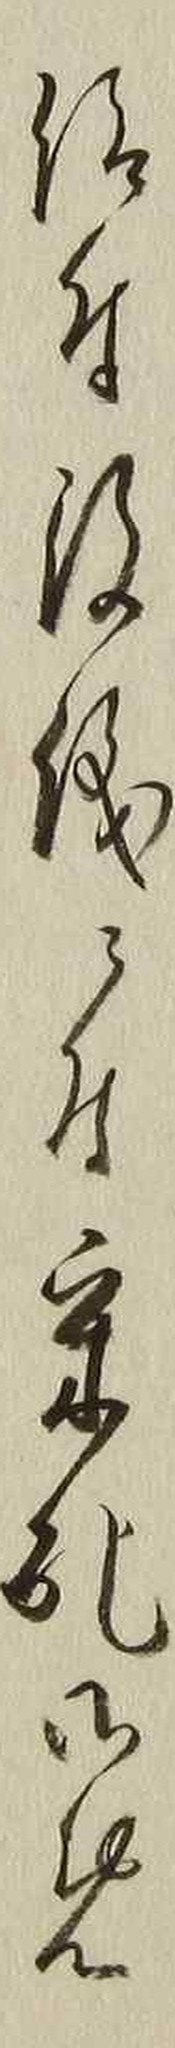被仰付役儀ニ付采配御免
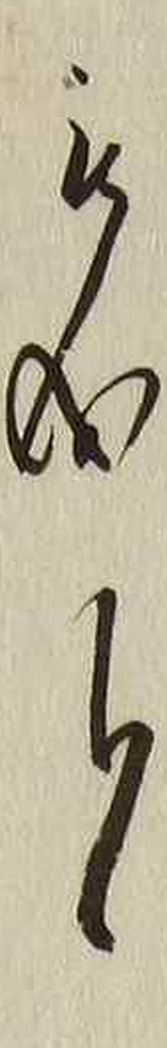被成下候
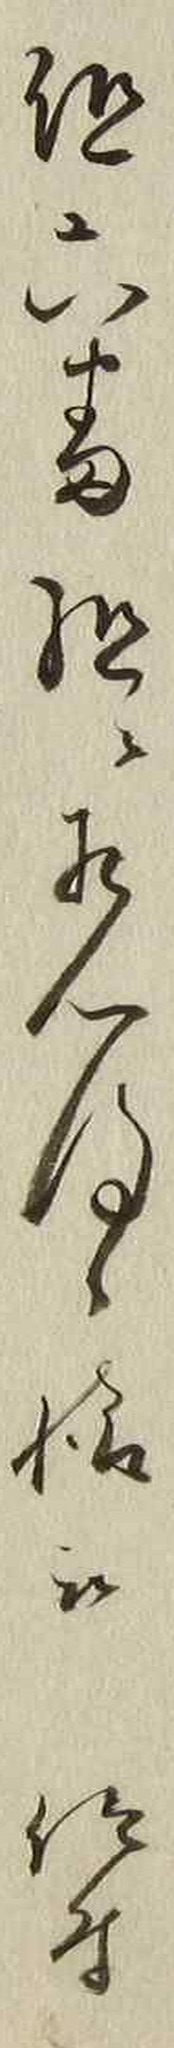但六番組ニ相心得候様被仰付
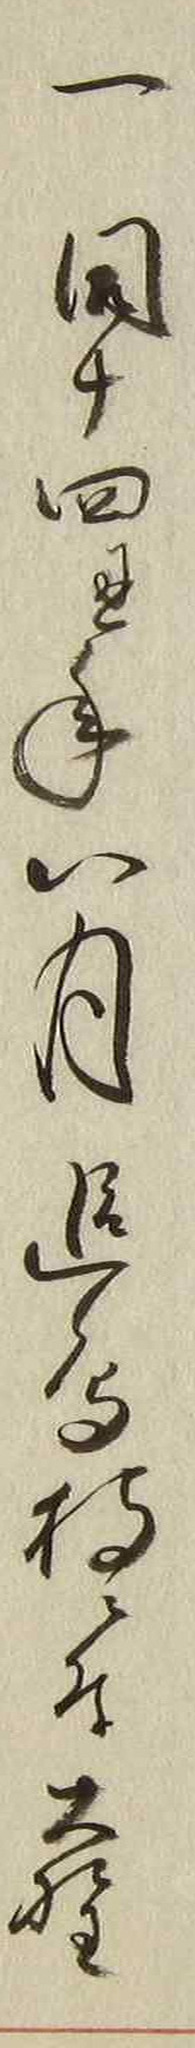一同十四丑年八月追鳥狩ニ付大野
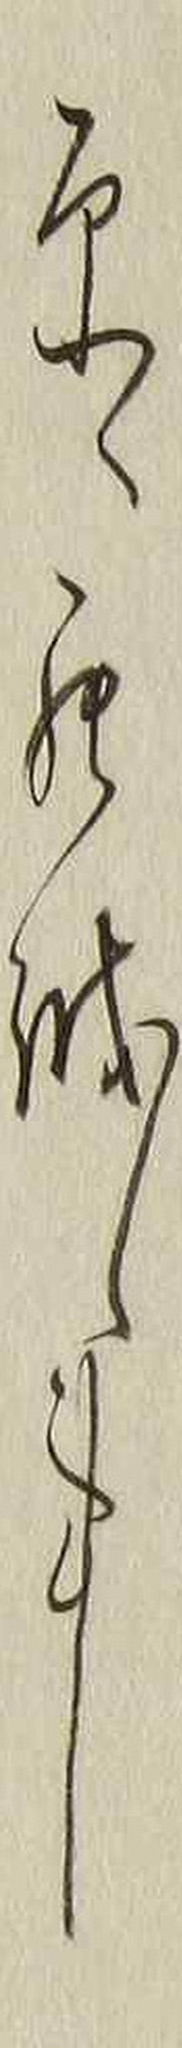原へ罷越候事
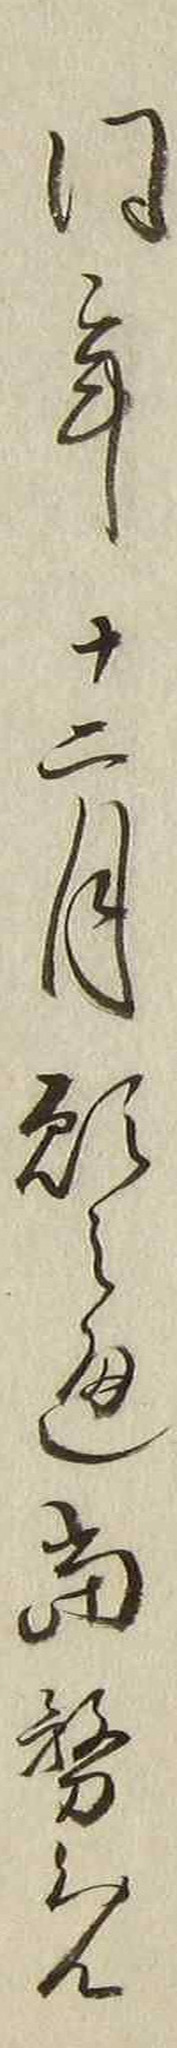一同年十二月願之通当務御免
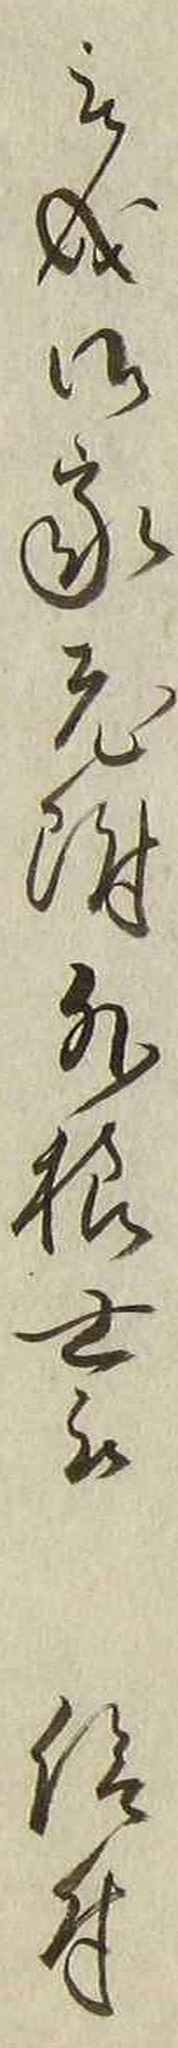被成御家老附外様士被仰付

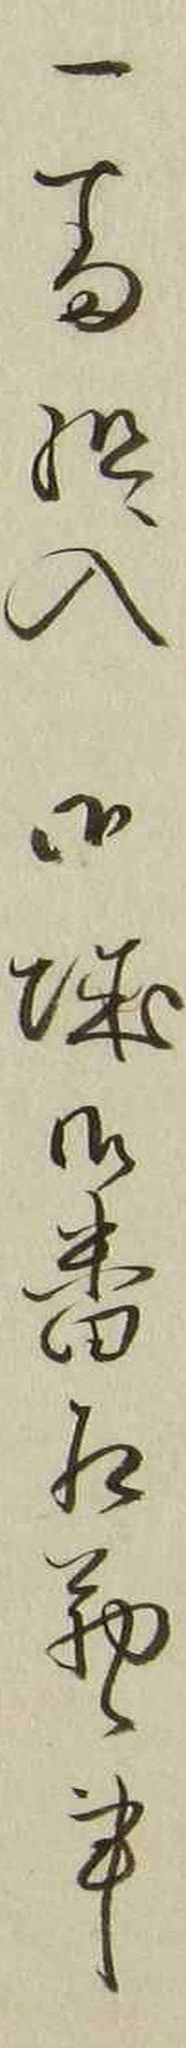一番組入御城御番相勤候事
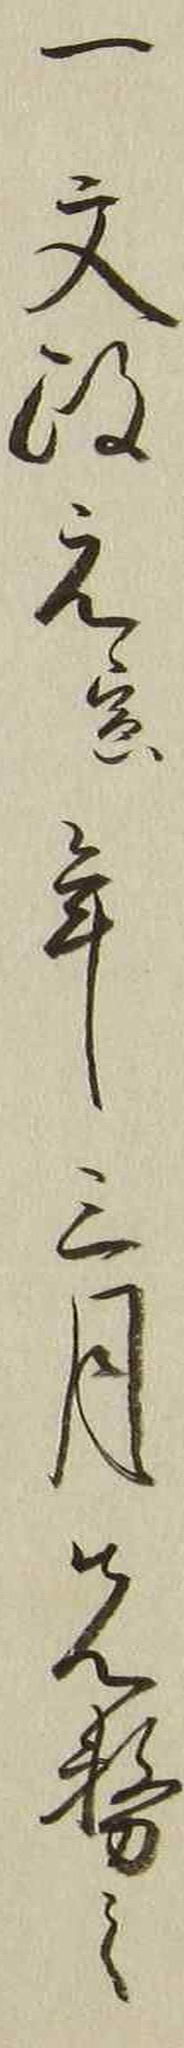一文政元寅年三月先務之
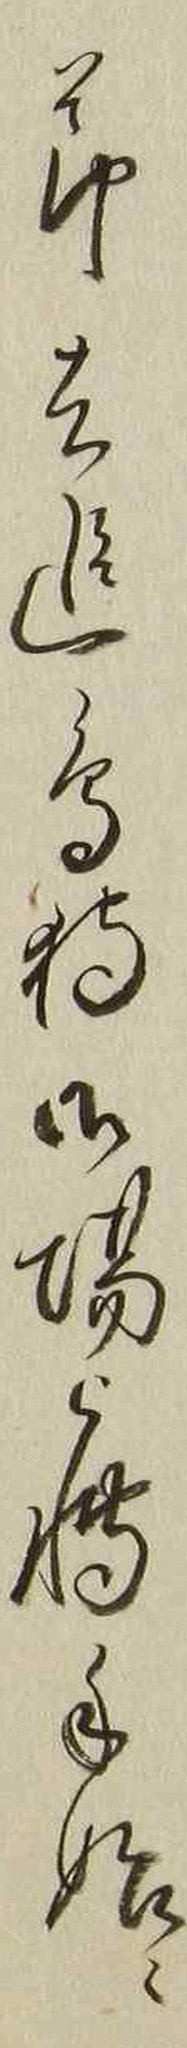節去追鳥狩御場被転手始ニ
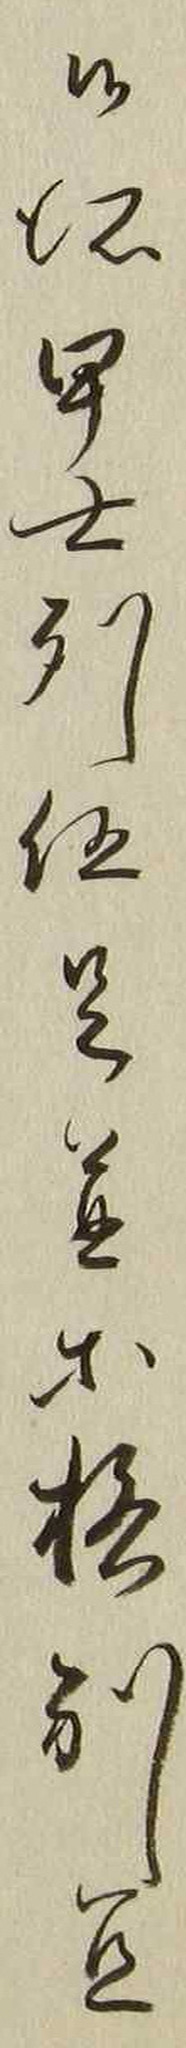候所早士列伍足並等格別宜
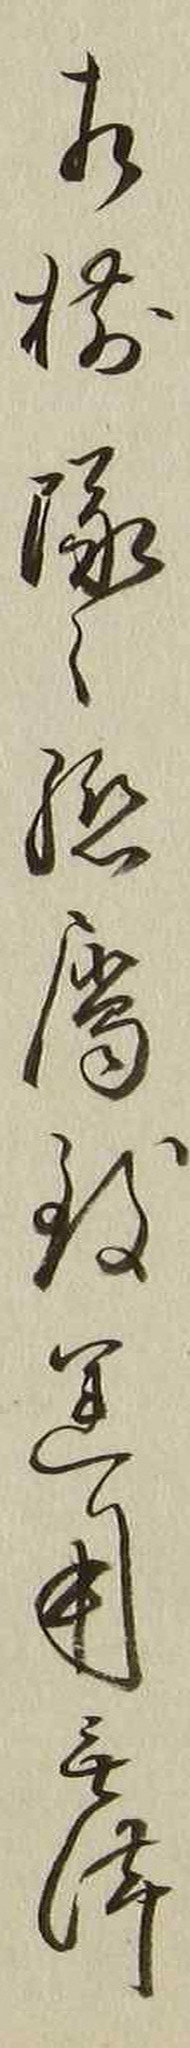相揃隊之聯属致運用無滞
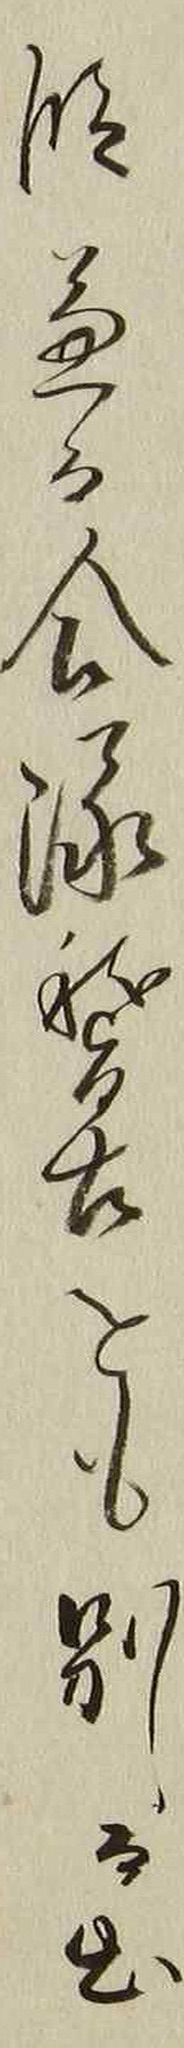段兼而合隊稽古をも別而出
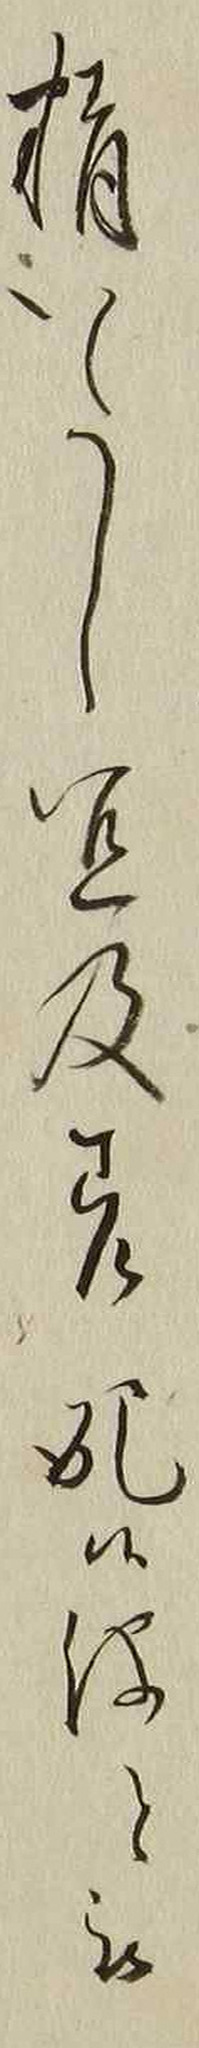精いたし宜及差配候儀と被
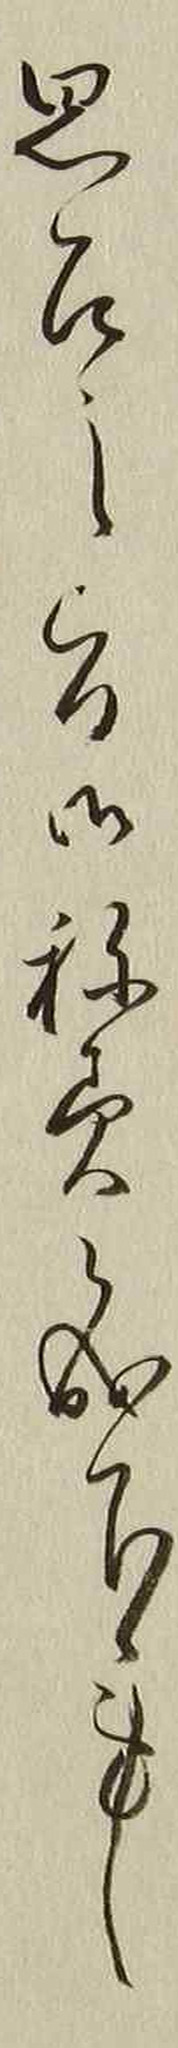思召之旨御称美被成下候事
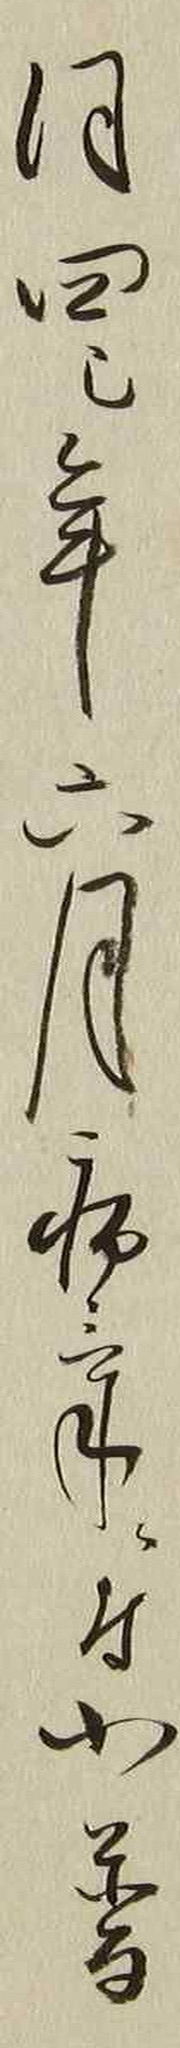同四巳年六月病気ニ付小普
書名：諸士系譜　巻之18　い之部18
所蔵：会津若松市立会津図書館
